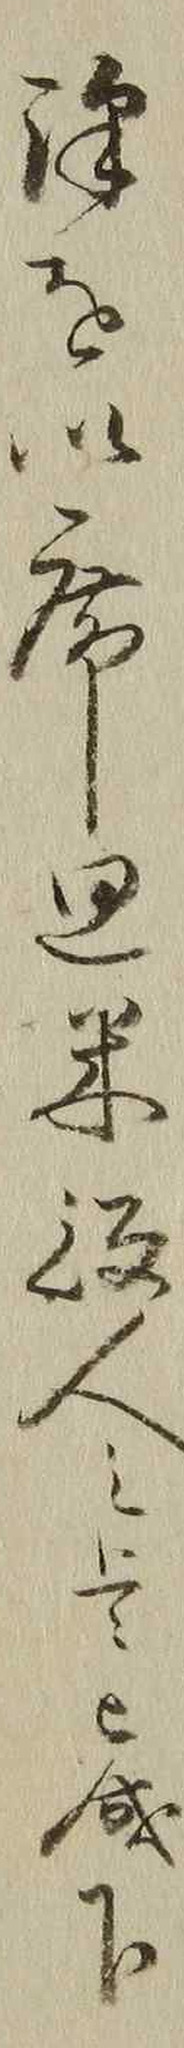訳を以席廻米役人之上ニ被成下
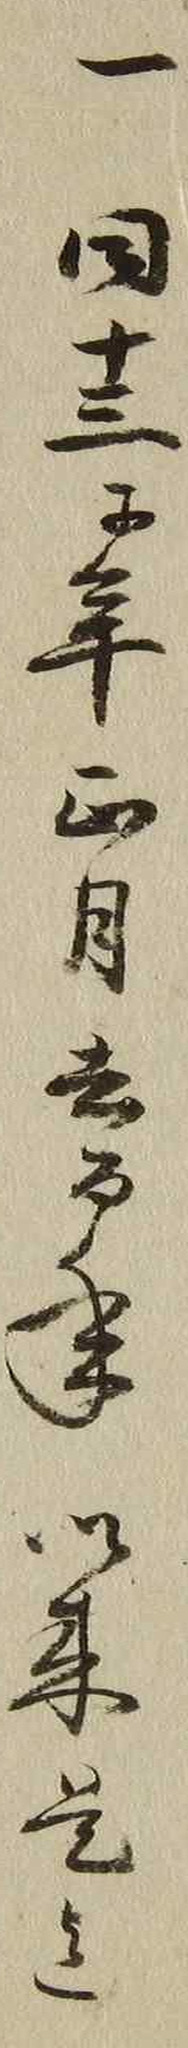一同十三子年正月去酉年以来是迄
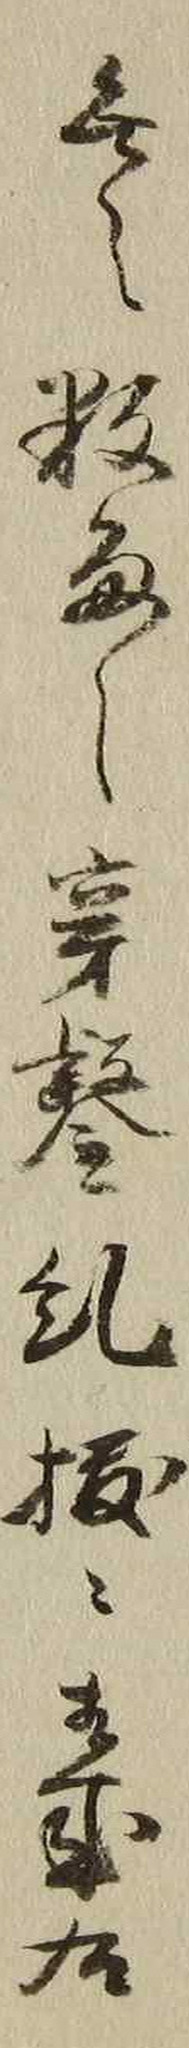無之数多之穿鑿糺抜ニ相成右
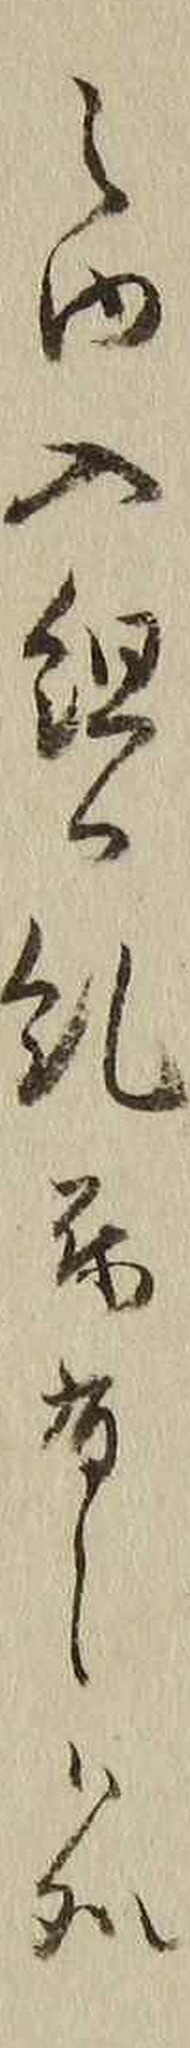之内入組御糺も有之候処
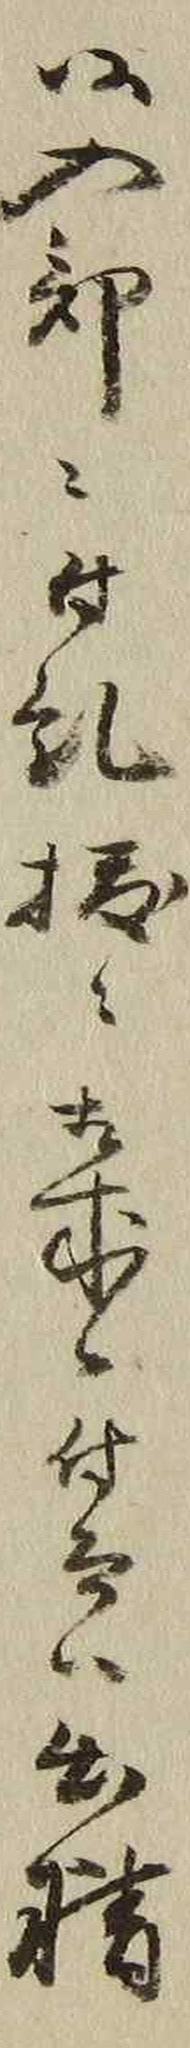御入部ニ付糺抜ニ相成候付而ハ出精
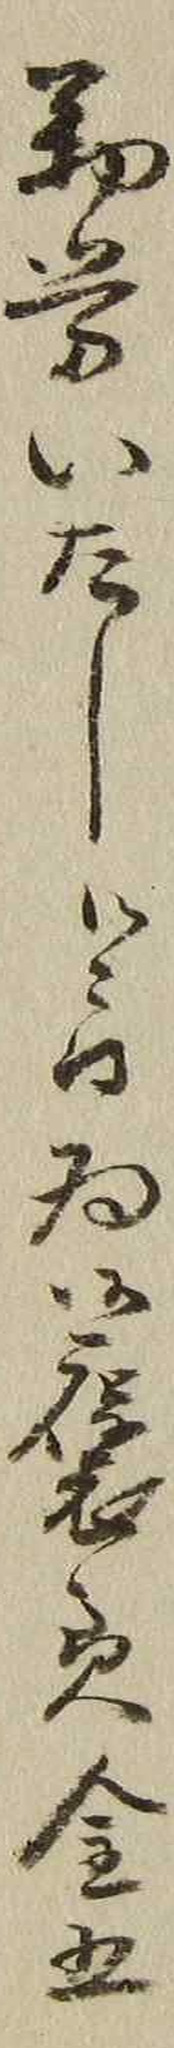勤労いたし候ニ付為御褒美金五
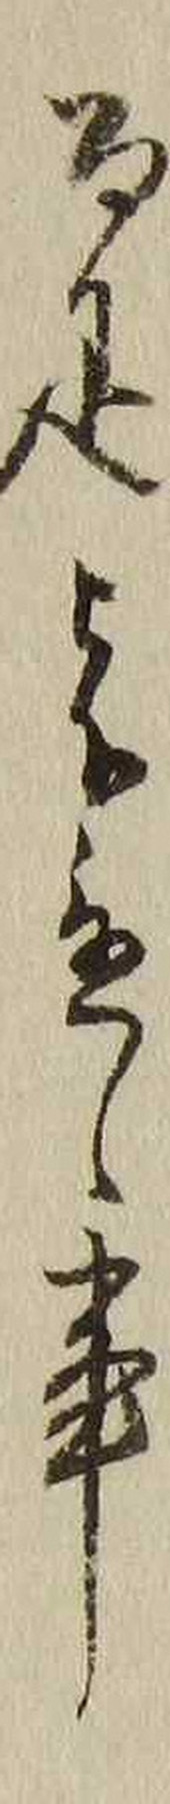百疋被下置候事
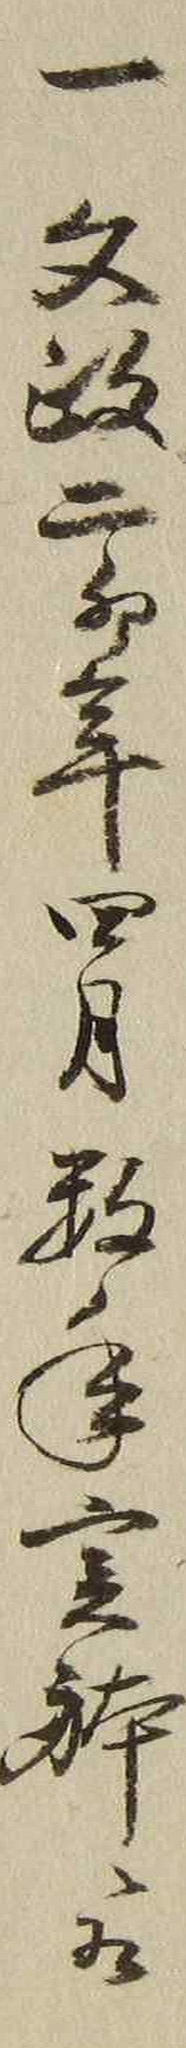一文政二卯年四月数年実体ニ相
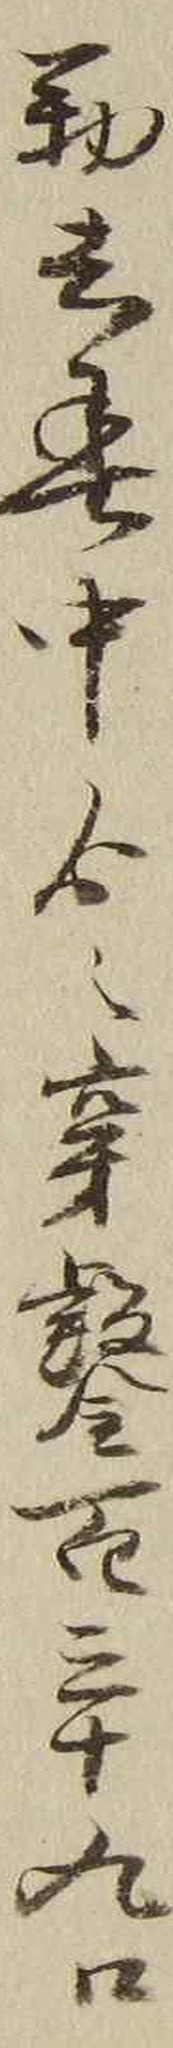勤去春中ゟ之穿鑿百三十九口
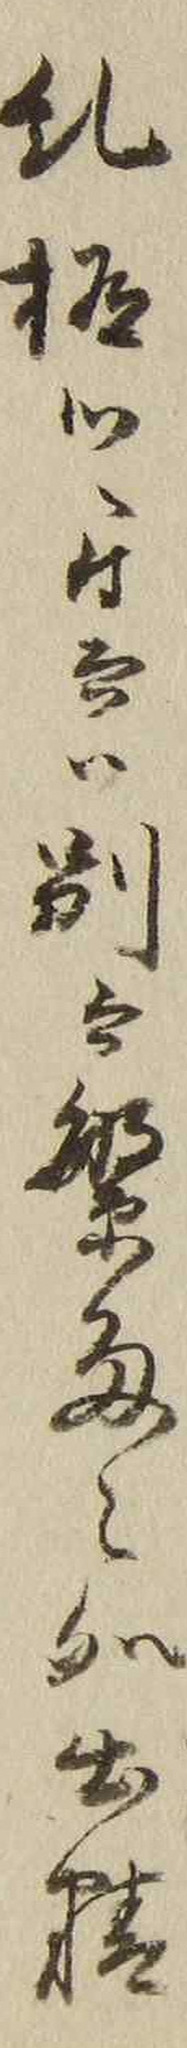糺極候ニ付而ハ別而繁多之処出精

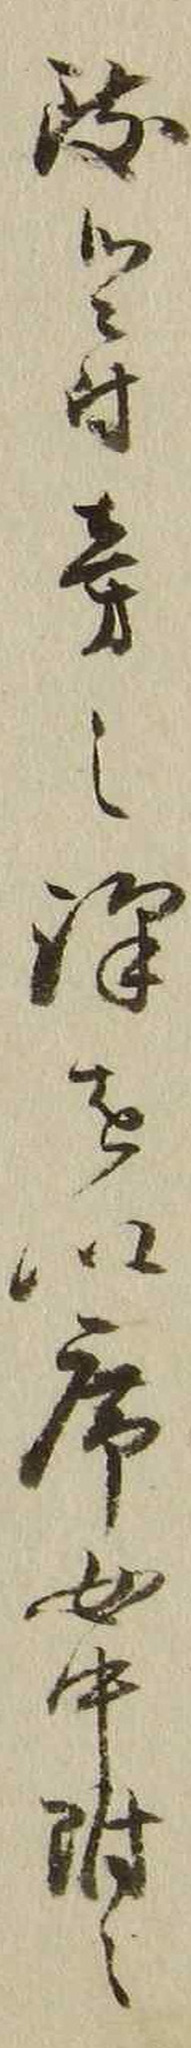致候ニ付旁之訳を以席女中附之
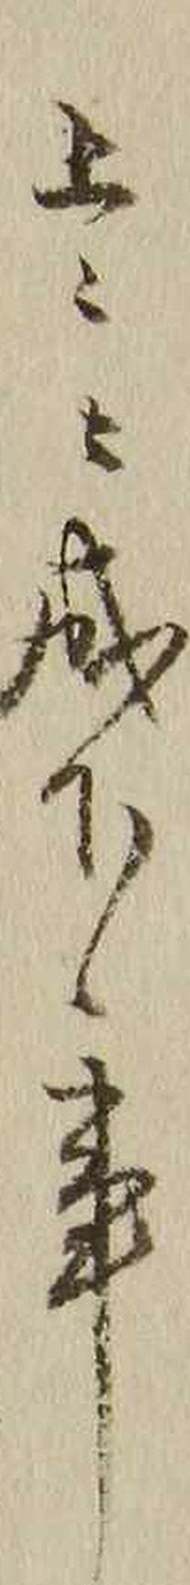上ニ被成下候事
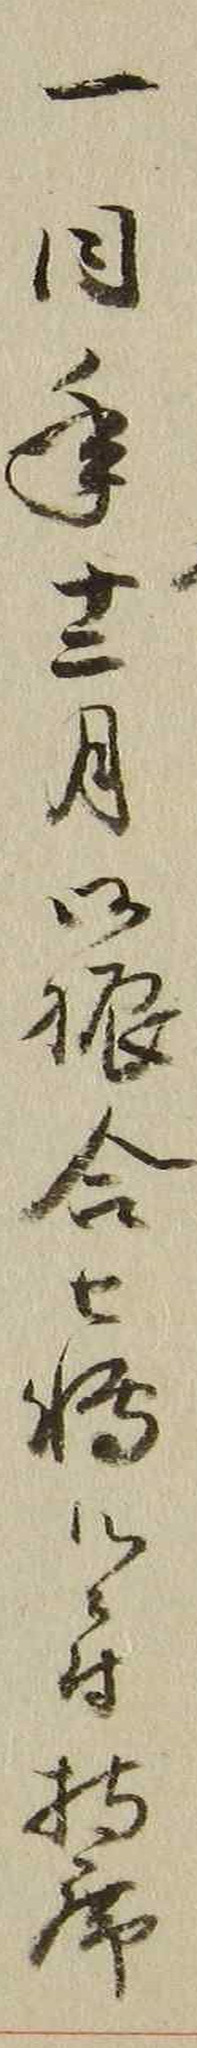一同年十二月御振合被転候ニ付持席
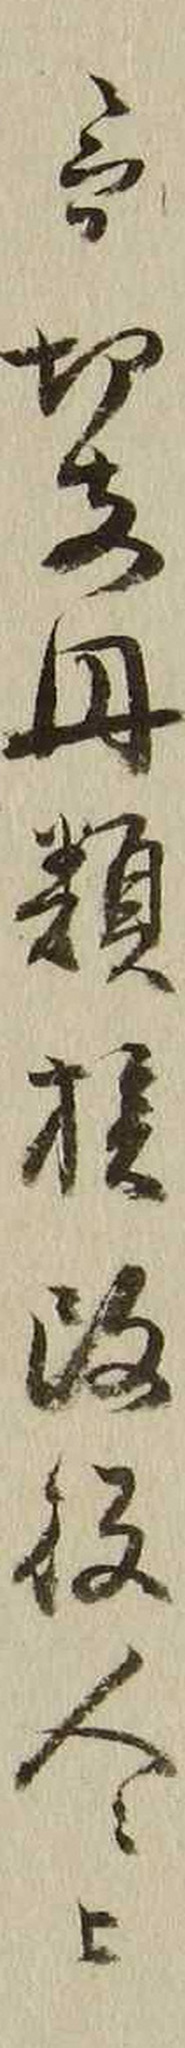ニ而切支丹類族改役人ニ被
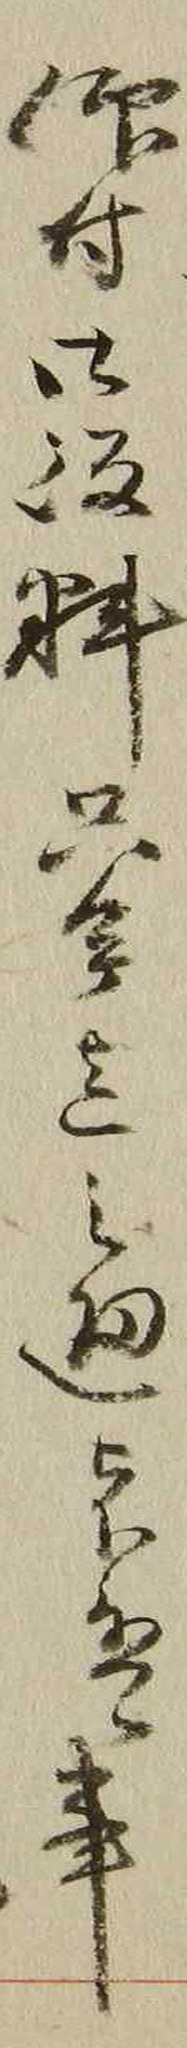仰付御役料只今迄之通被下置候事
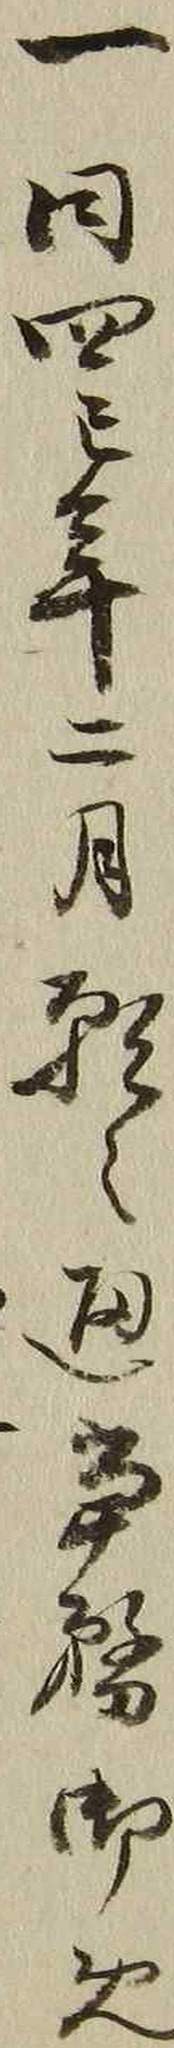一同四巳年二月願之通当務御免
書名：諸士系譜　巻之236　ふ之部4
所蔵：会津若松市立会津図書館
